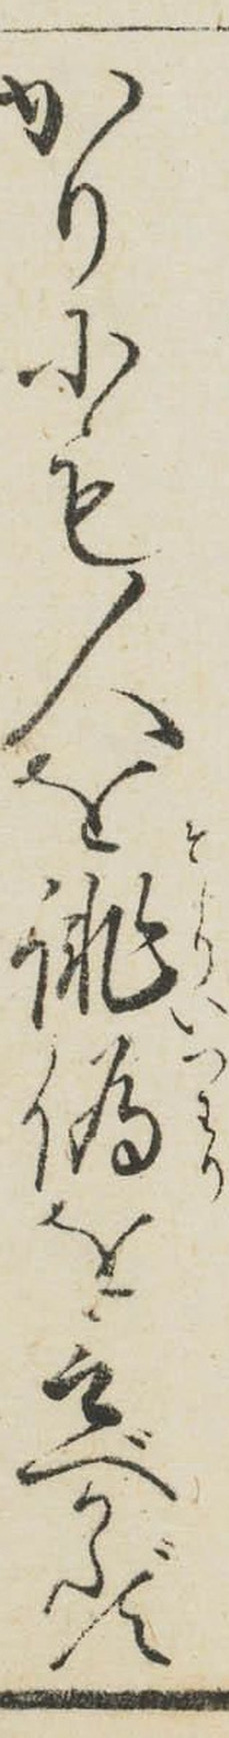かりにも人を誹偽を言べからず
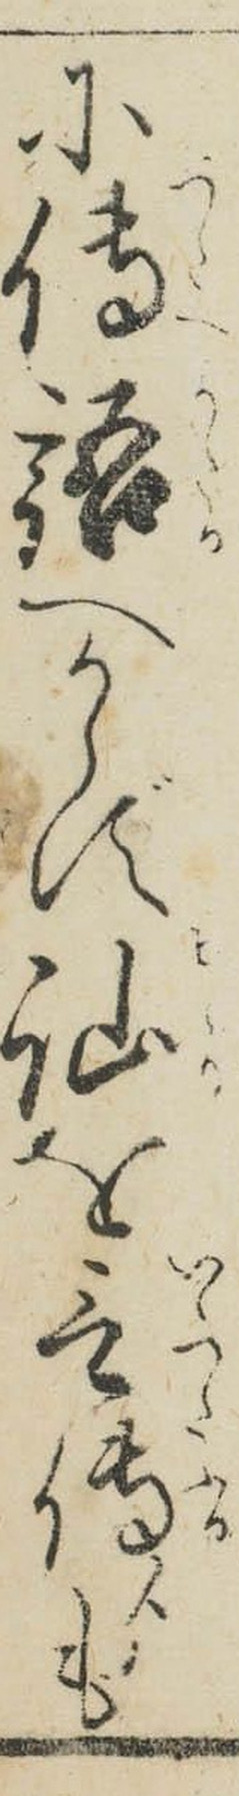に伝語へからず訕を言伝よりも

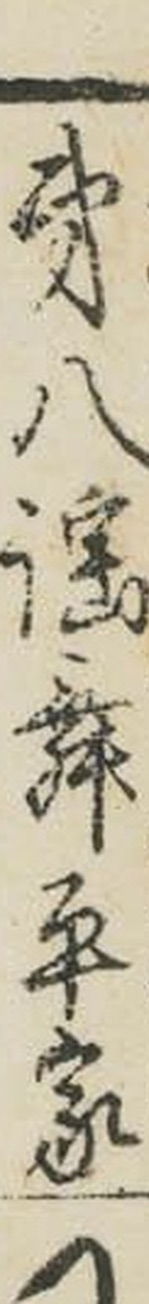第八謡舞平家
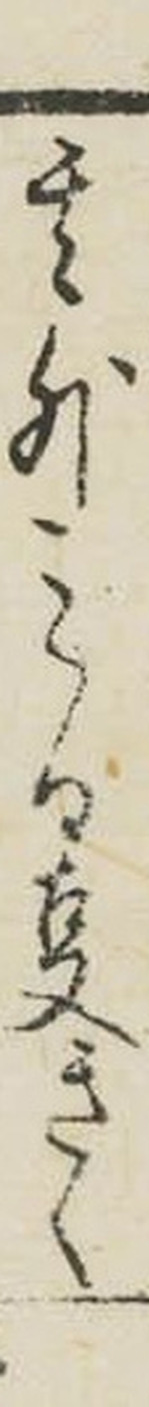其外みる事きく
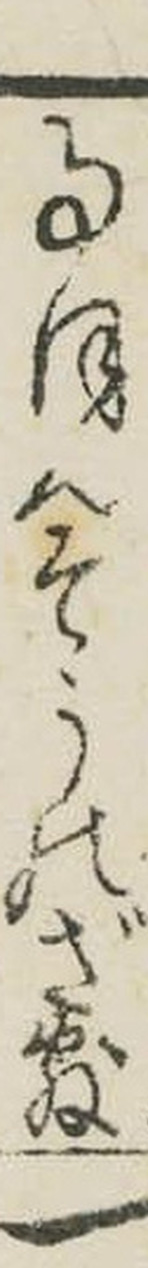事ほんそうのざ敷
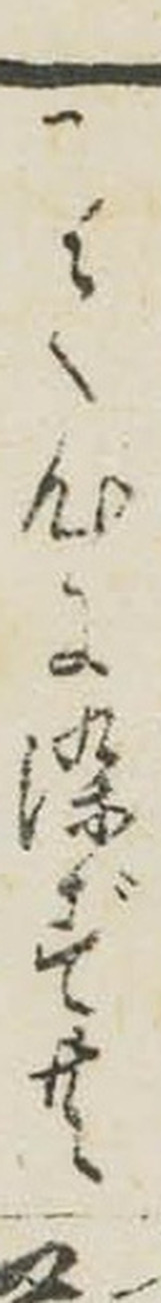て心に染ず共
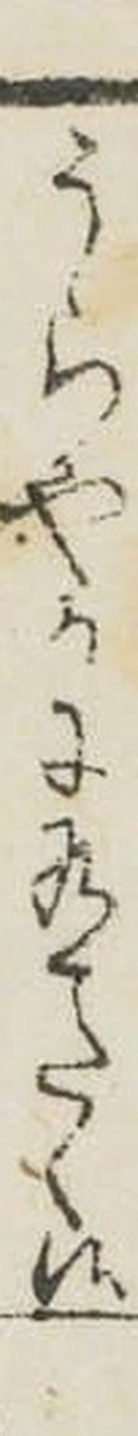うらやかに有たく候
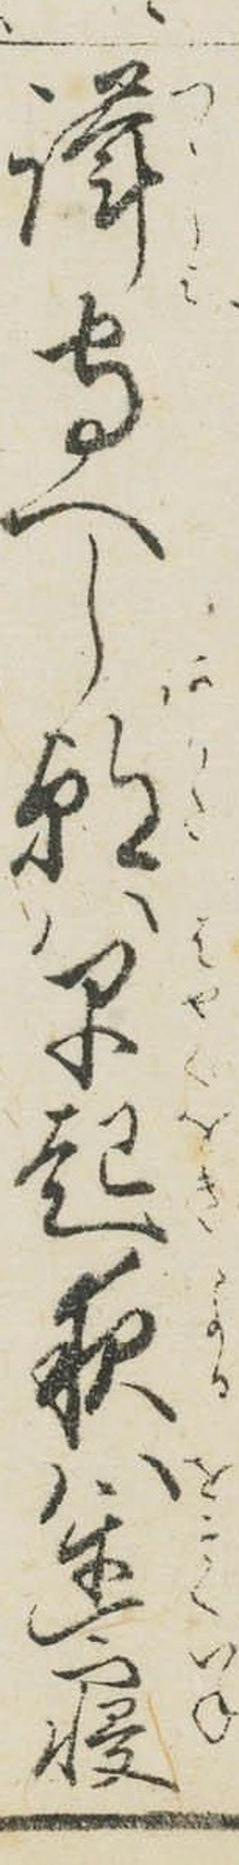謹守へし朝は早起夜は遅寝
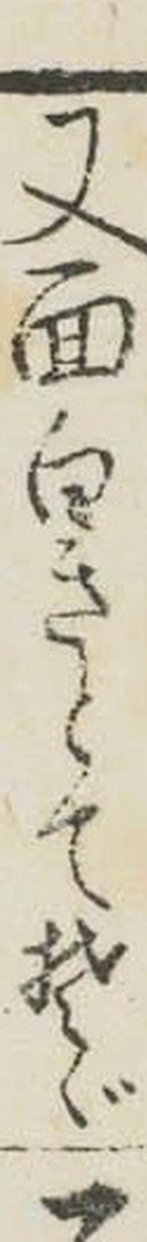又面白きとてそゞ
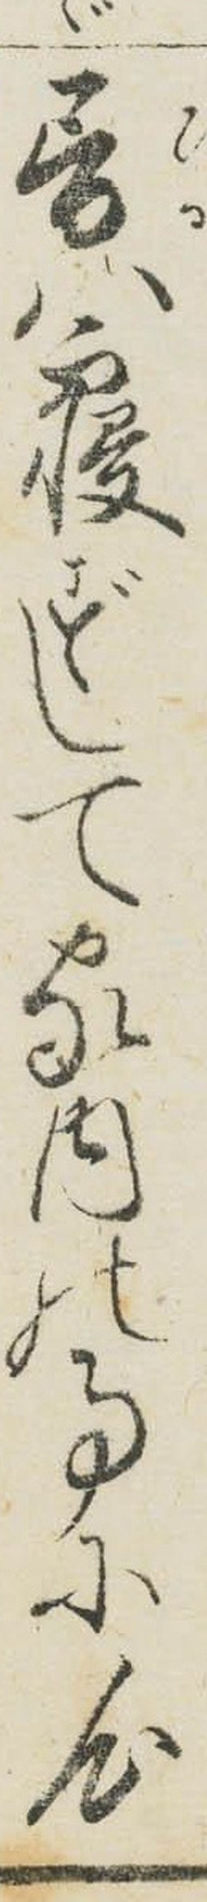昼は寝ずして家内の事に心
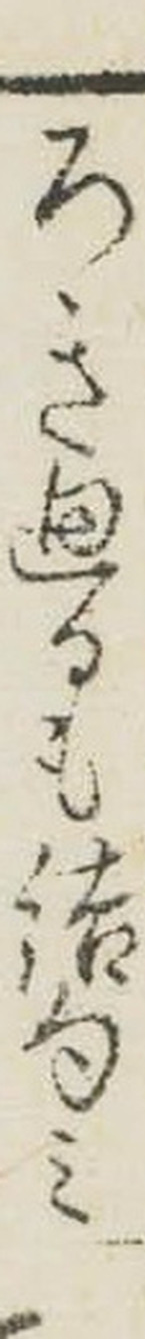ろき廻るも結句み
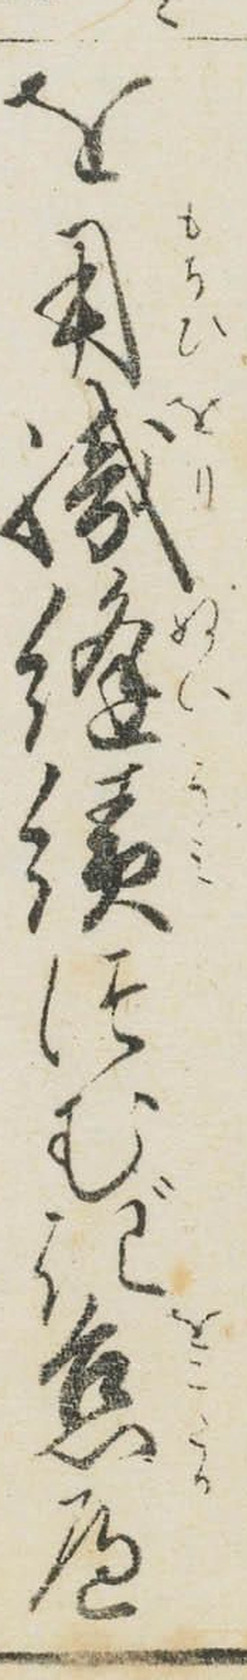を用織縫績つむぎ怠へ
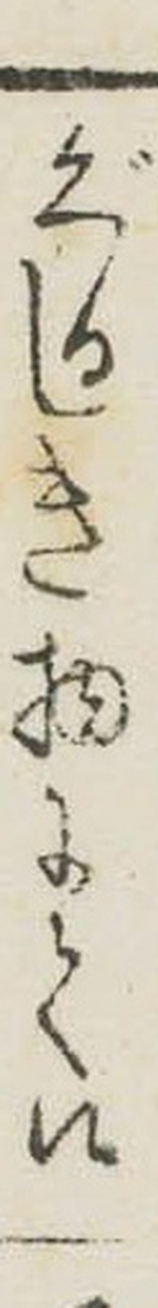ぐるしき物にて候
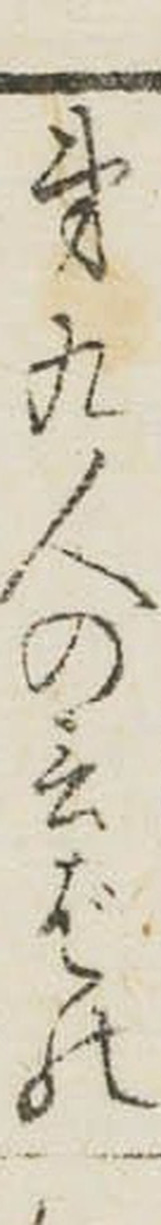第九人の言ばの
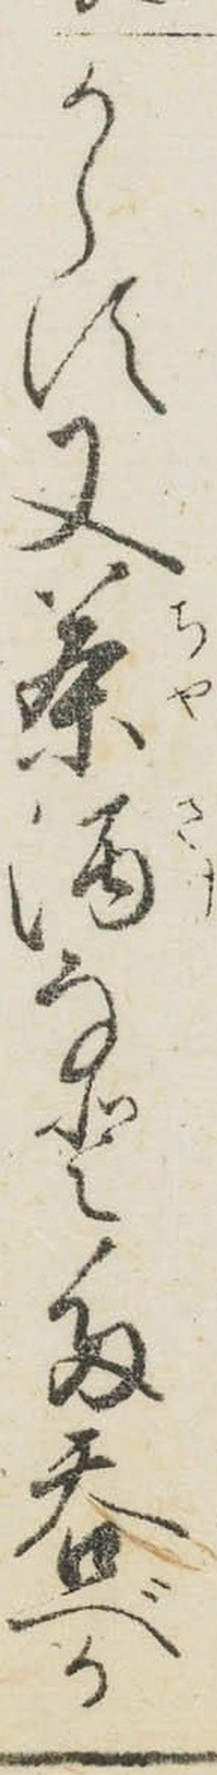からす又茶酒なと多呑べか
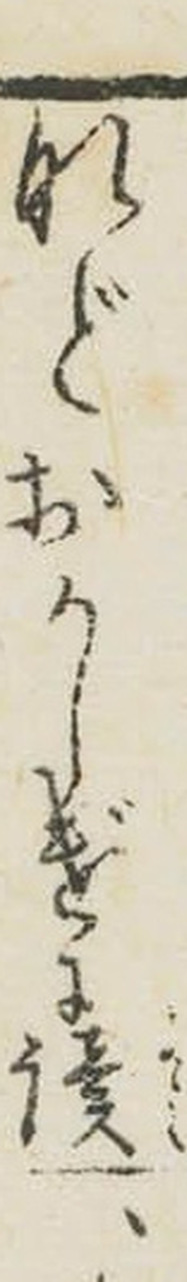などおかしげに読
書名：女大学
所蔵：東京学芸大学教育コンテンツアーカイブ
